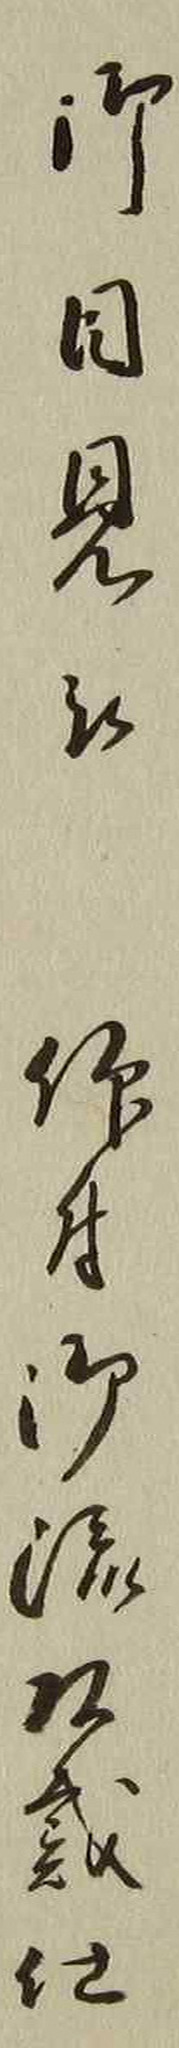御目見被仰付御流頂戴仕
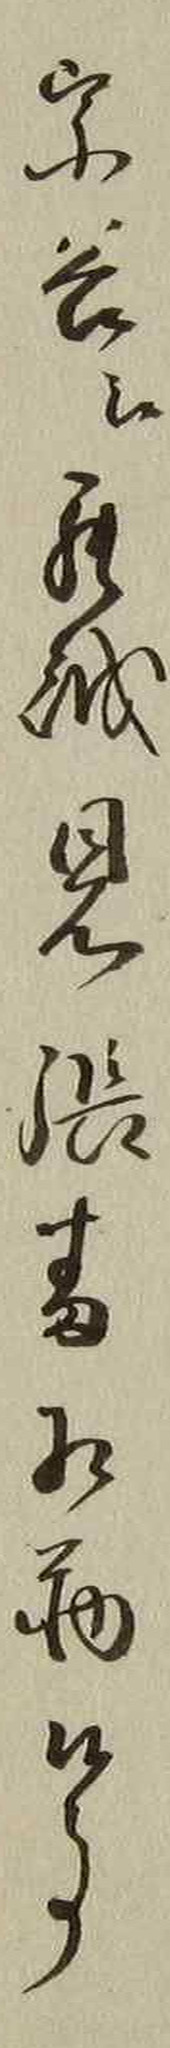宗谷江罷越見張番相勤候事
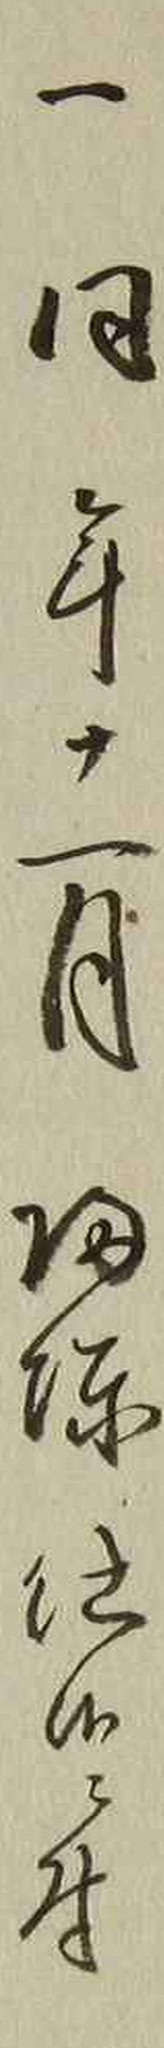一同年十一月帰陣仕候ニ付
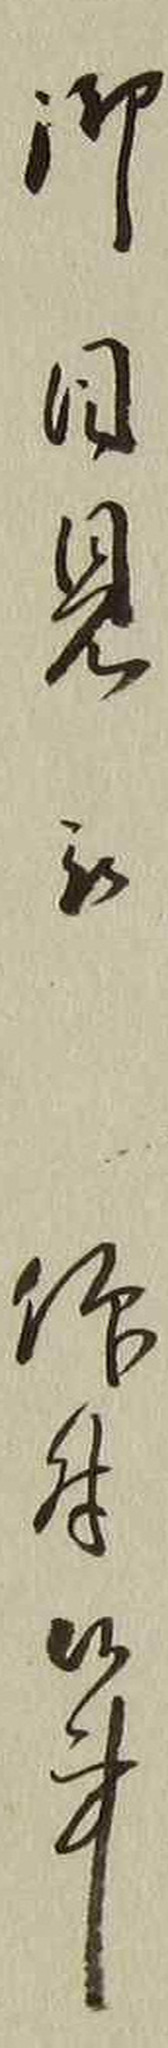御目見被仰付候事
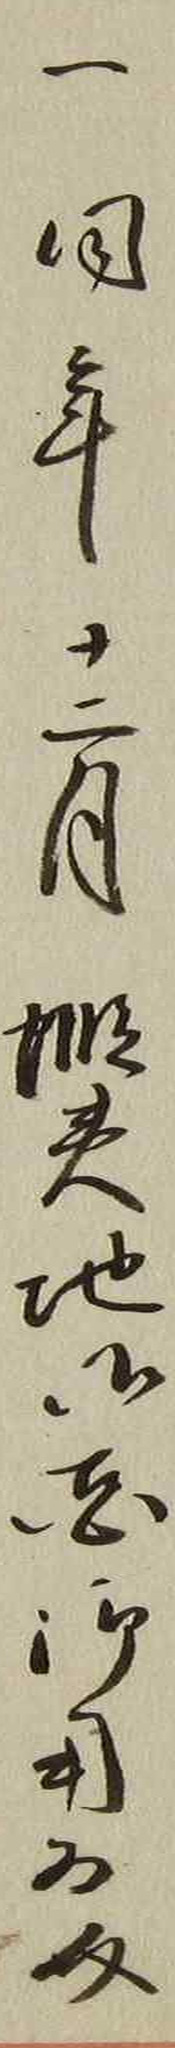一同年十二月蝦夷地御固御用為介
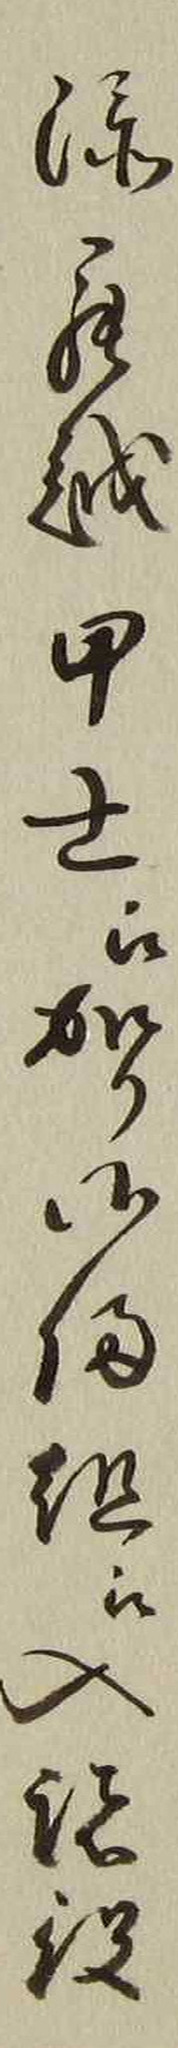添罷越甲士江加り御備組江入諸役
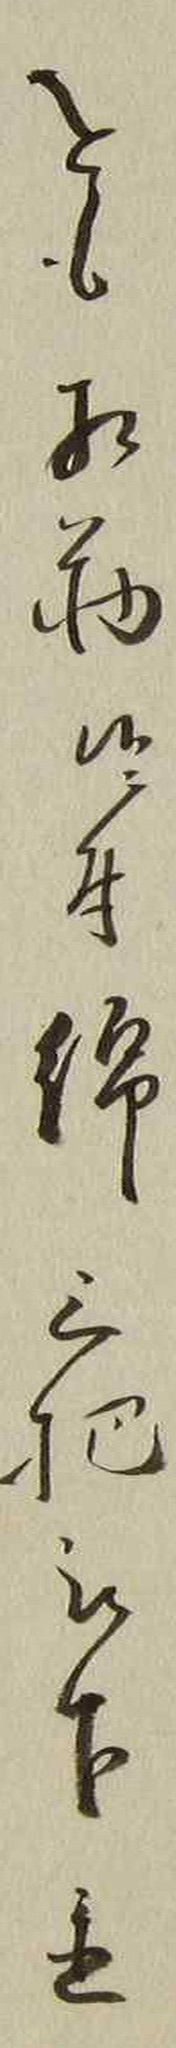をも相勤候ニ付綿三把被下置
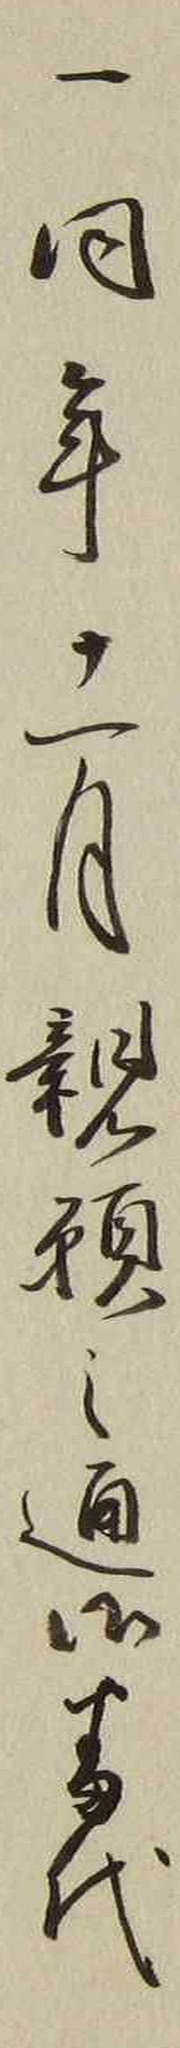一同年十一月親願之通御番代
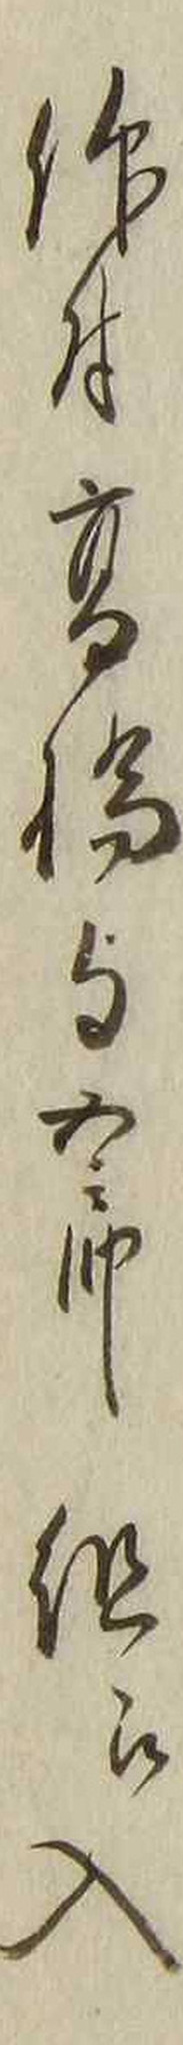被仰付高橋与五郎組江入

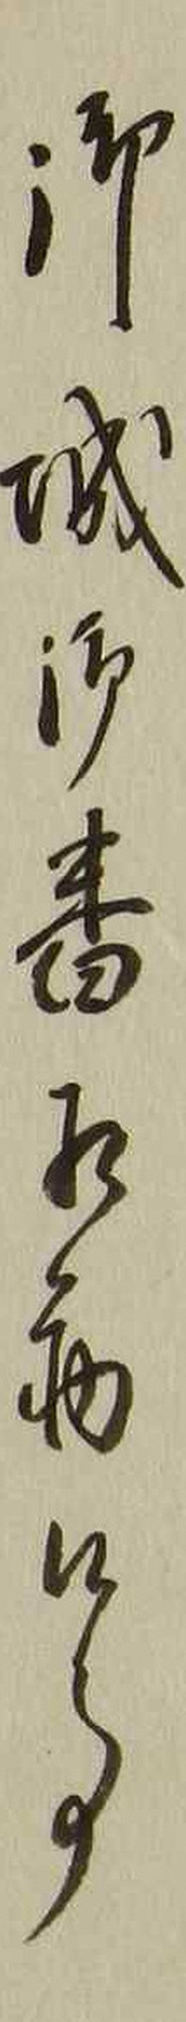御城御番相勤候事
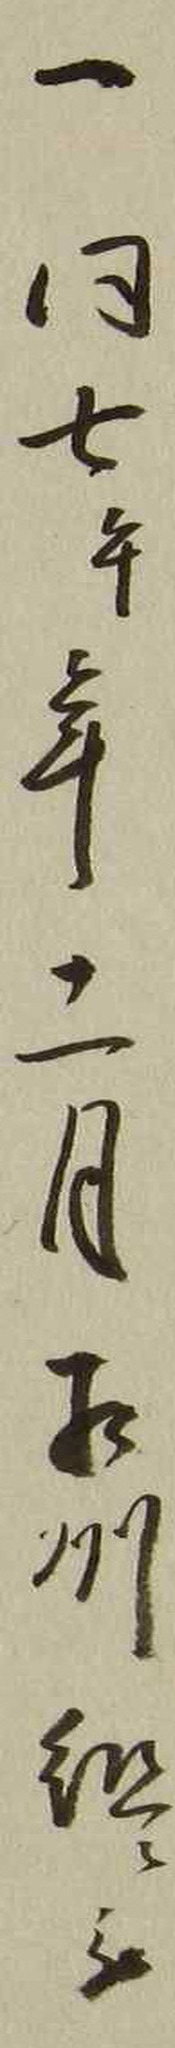一同七午年十一月相州組ニ被
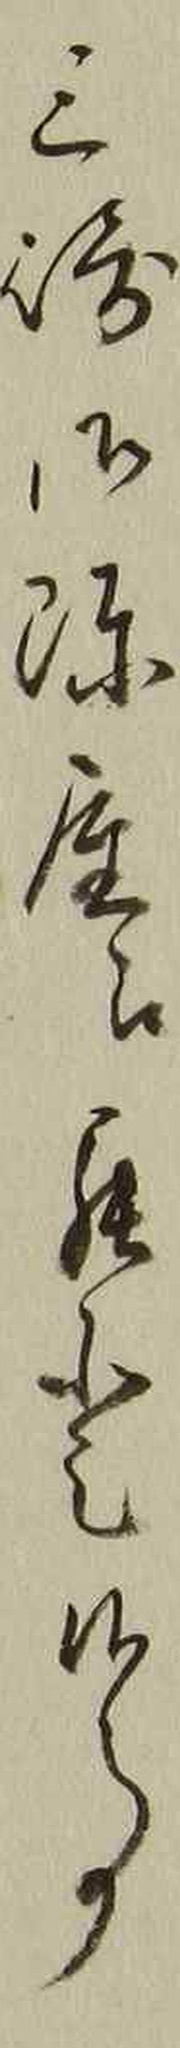三崎御陣屋江罷登候事
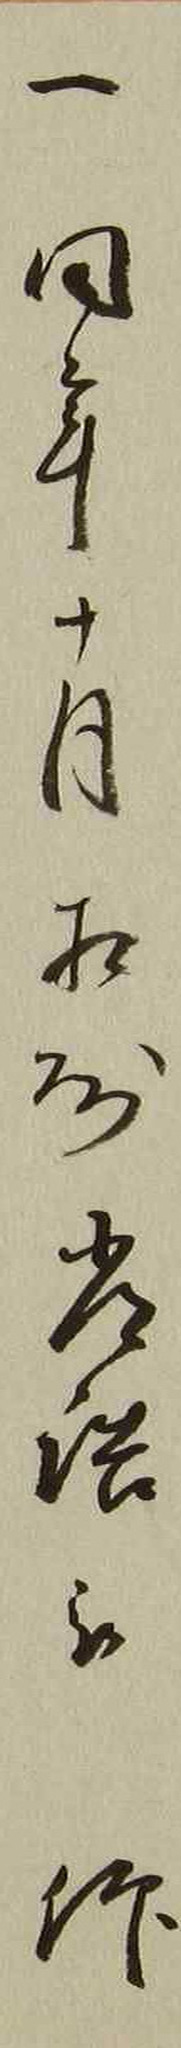一同年十月相州常詰被仰
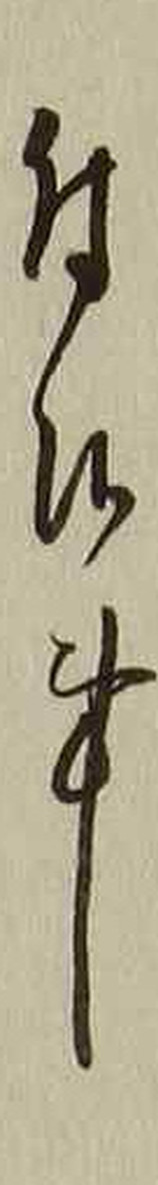付候事
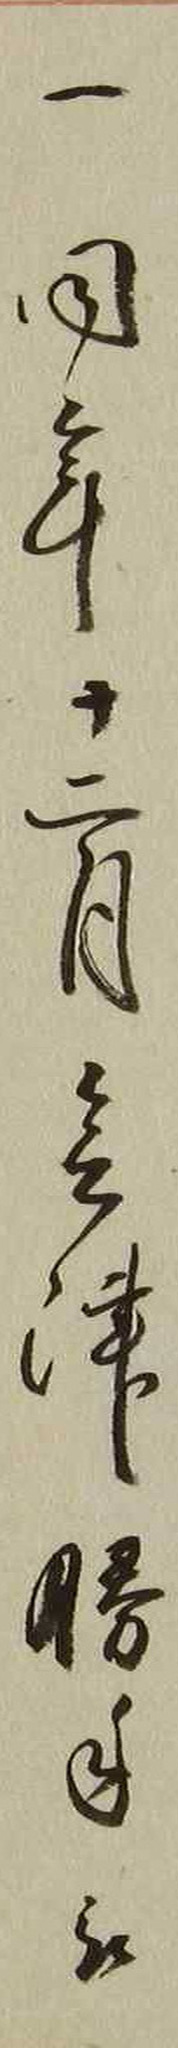一同年十二月会津勝手被
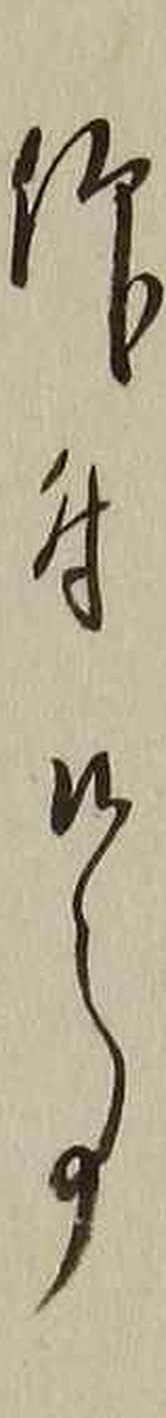仰付候事
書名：諸士系譜　巻之122　よ之部5
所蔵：会津若松市立会津図書館
